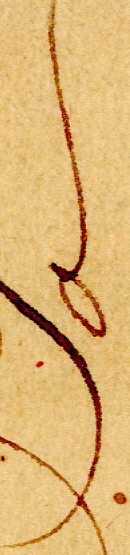To
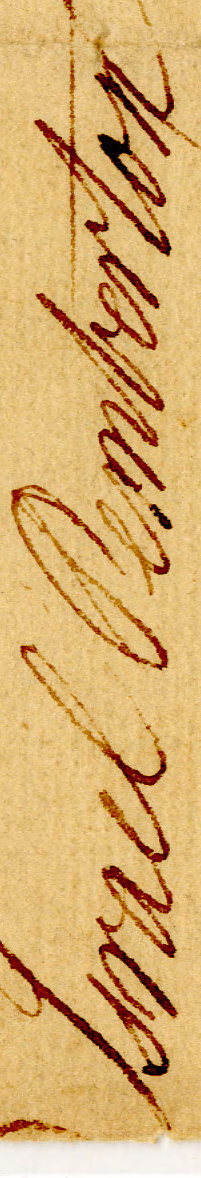Israel Pemberton
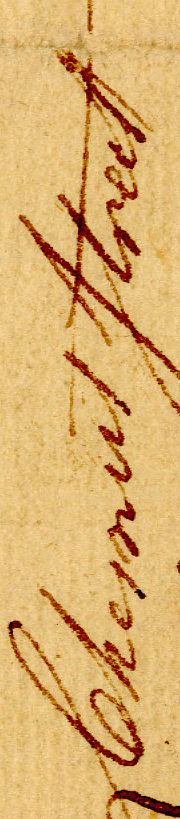Chestnut Street
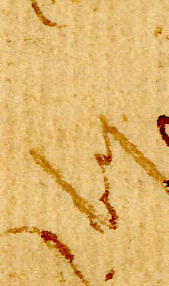by
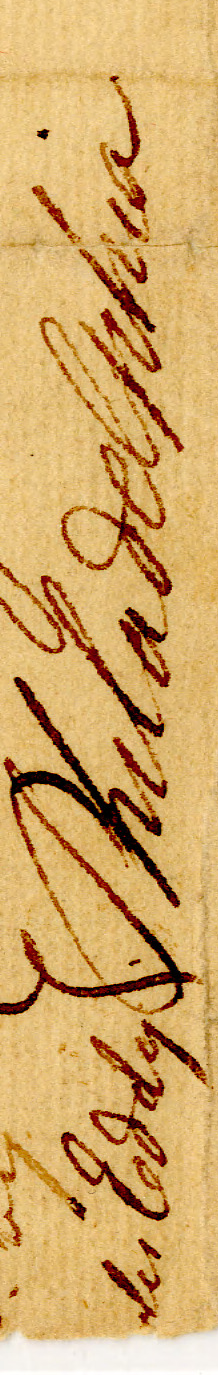der Eddy Philadelphia
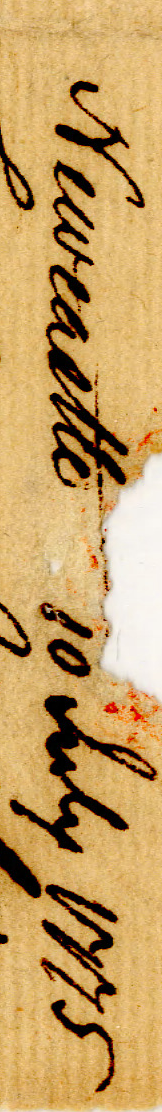Newcastle 10 July 1775
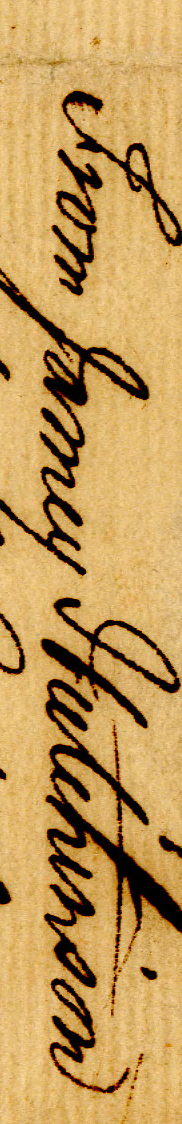From Jamey Hutchinson
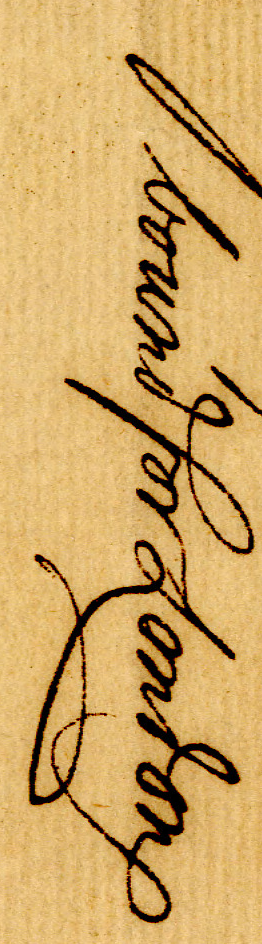bound for London
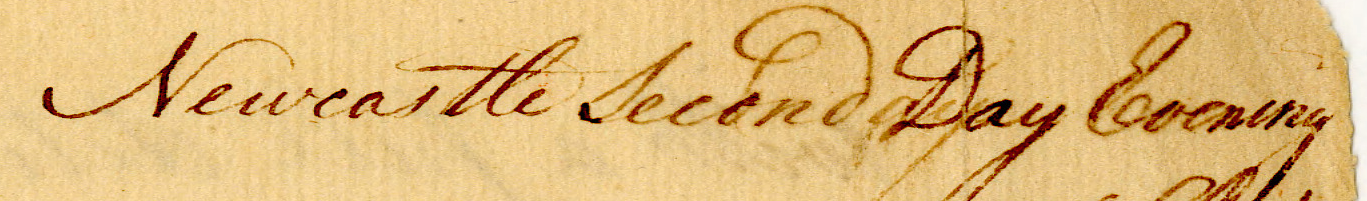Newcastle Second Day Evening
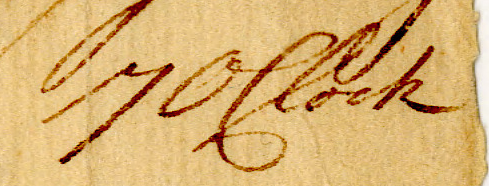7 oClock
